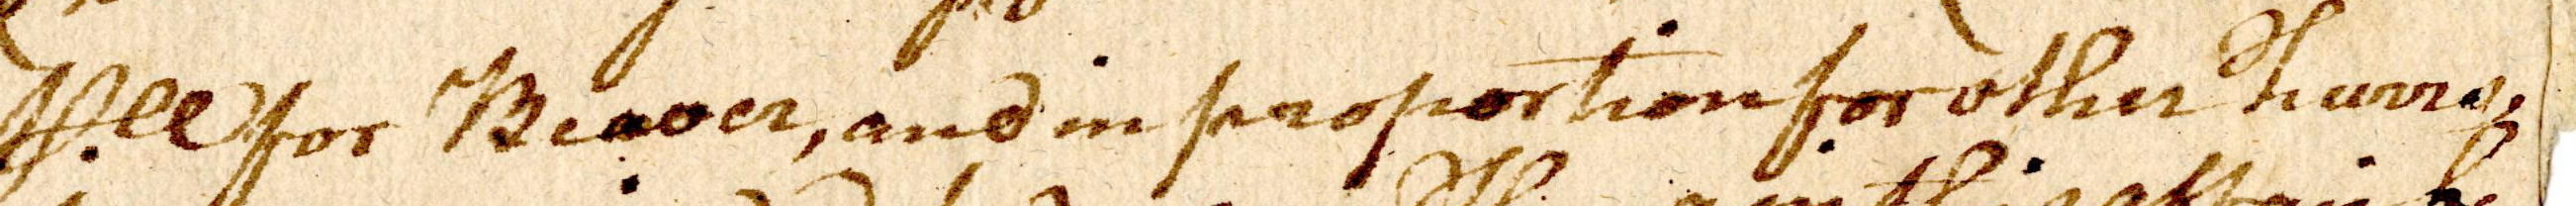p^ce. for Beaver, and in proportion for other Furrs
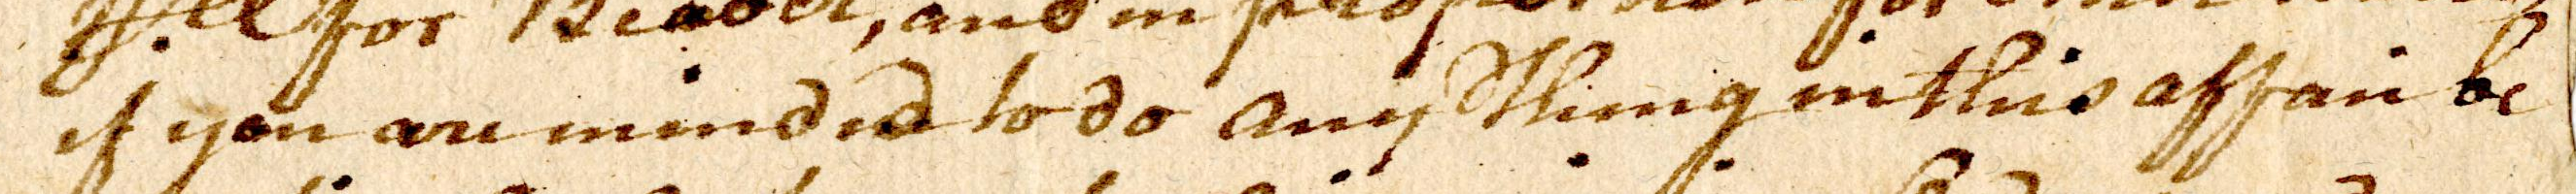if you are minded to do Any thing in this affair be
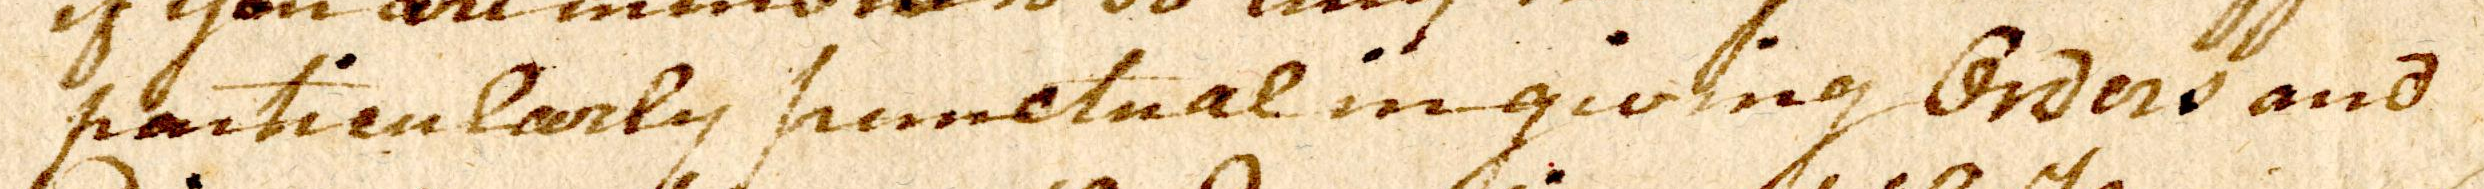particularly punctual in giving orders and
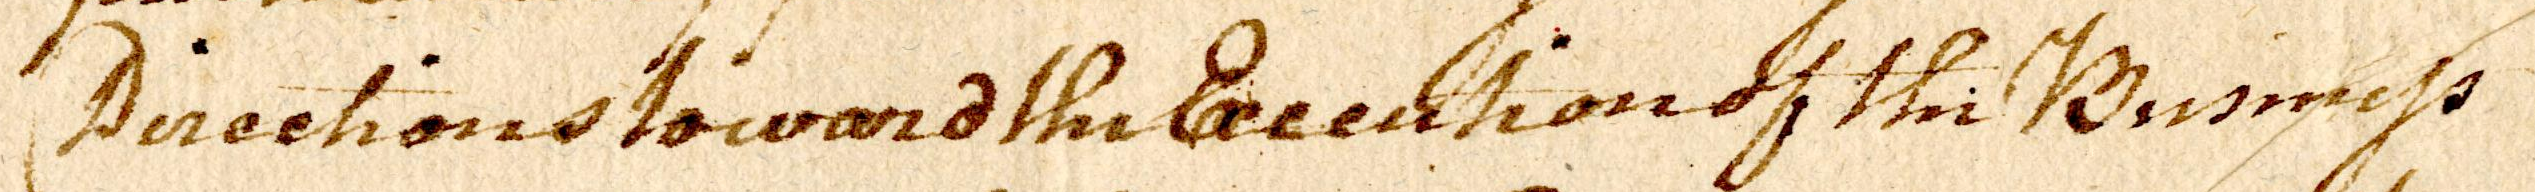Directions toward the Execution of the Buisness
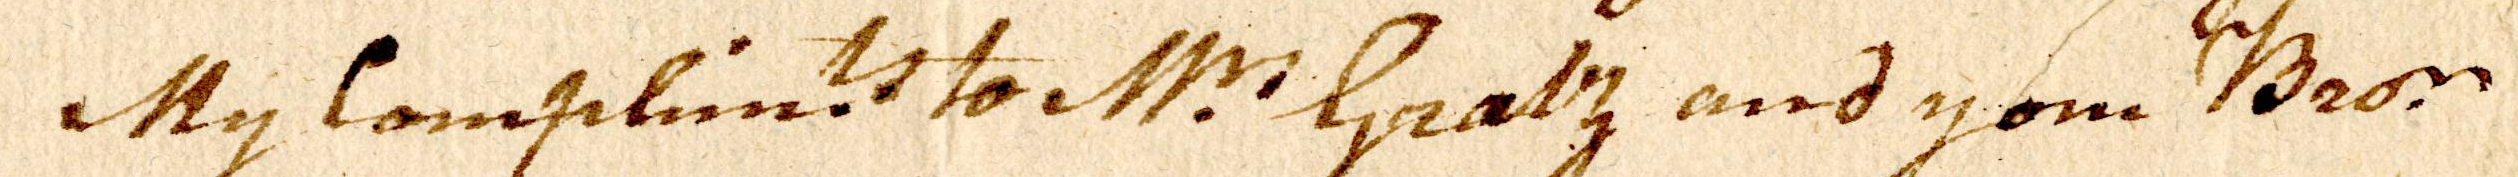My Compliment to M^rs. Gratz and your Bro^r
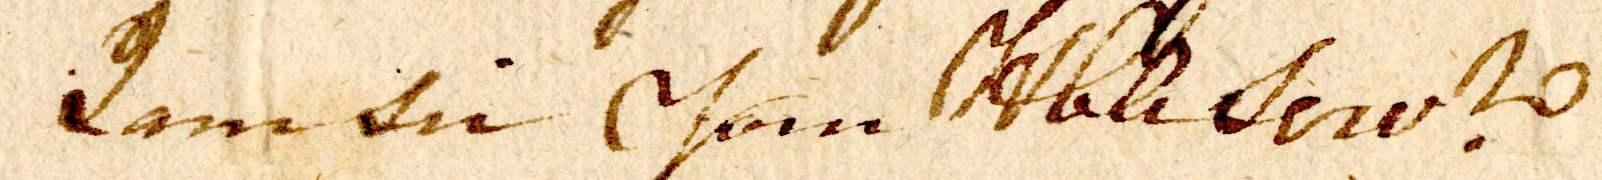I am sir your Hble Serv^t.
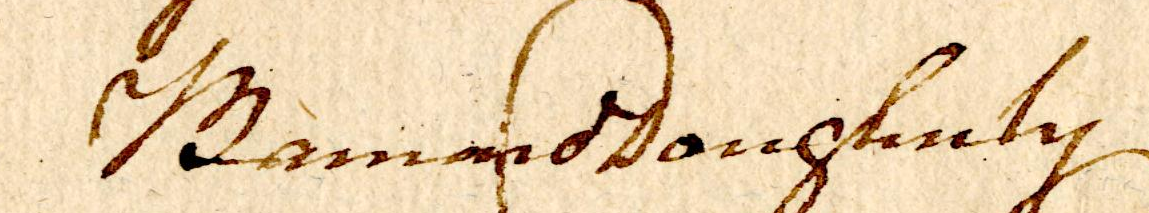Barnard Daughtry
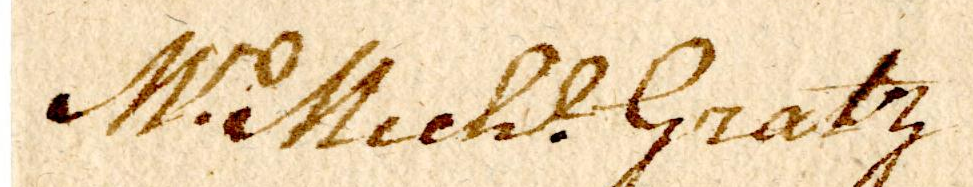M^. Mich^l. Gratz
